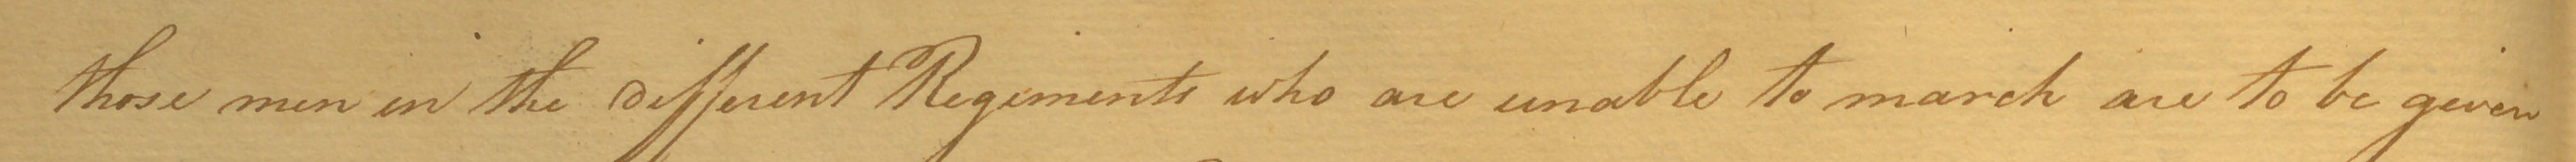those men in the different Regiments who are unable to march are to be given
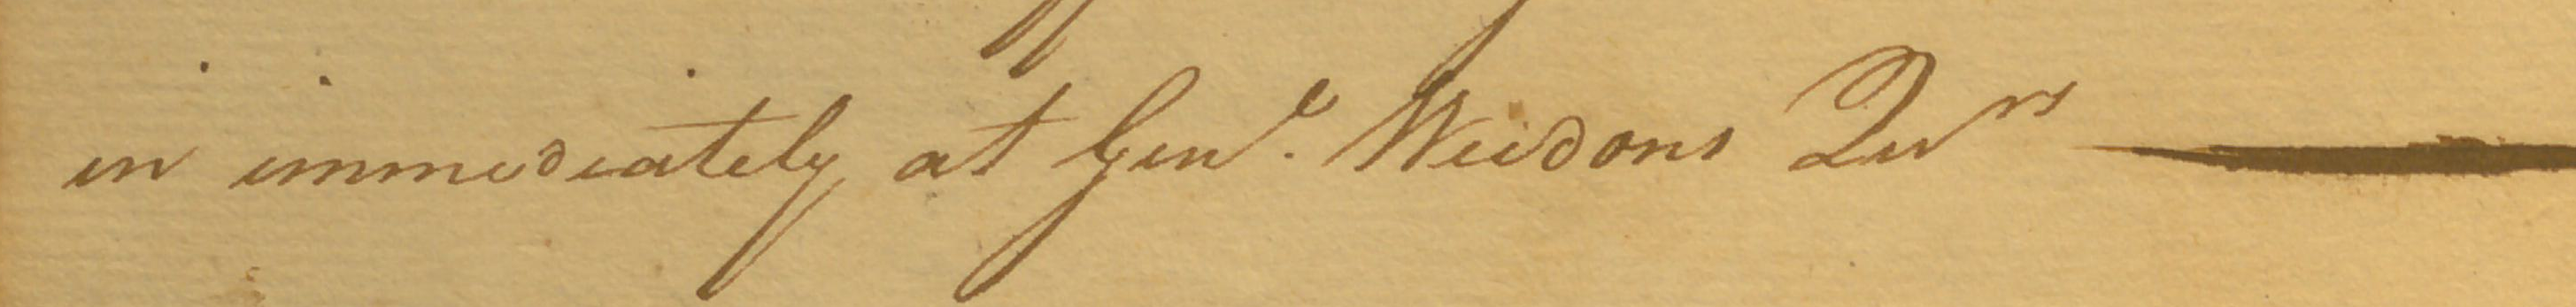in immediately at Gen^l. Weedons Qu^rs-
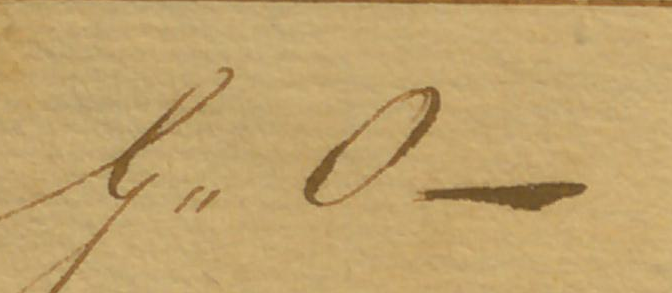G.O-
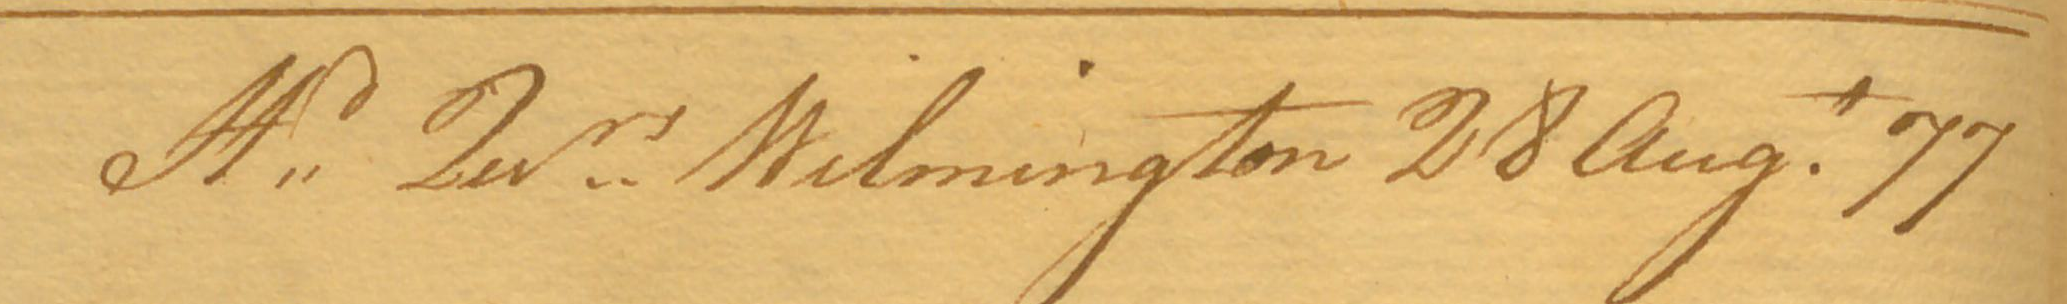H^d. Qu^rs. Wilmington 28 Aug^t. 77
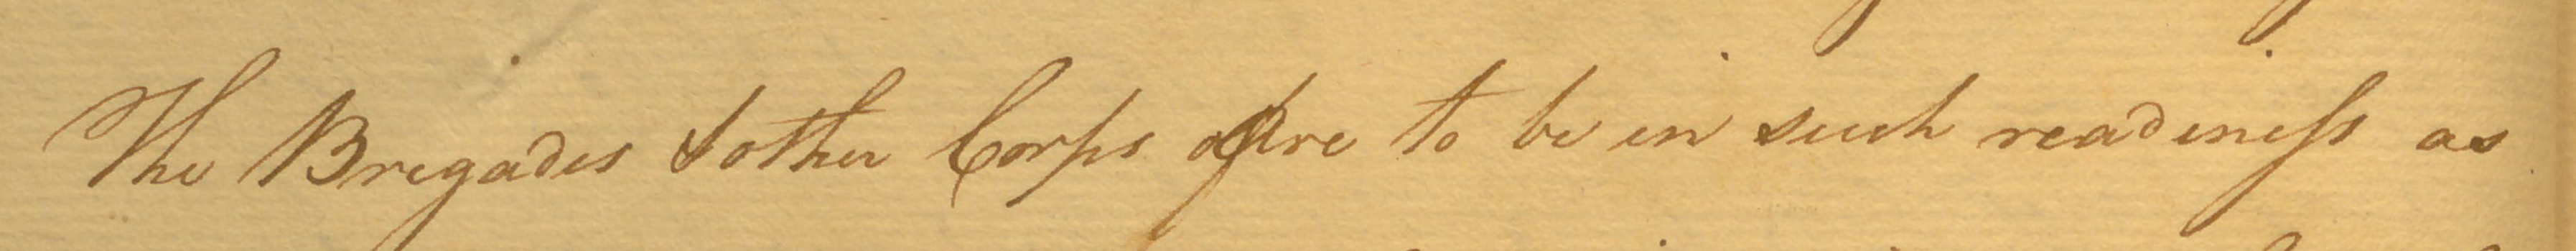The Brigades & other Corps are to be in such readiness as
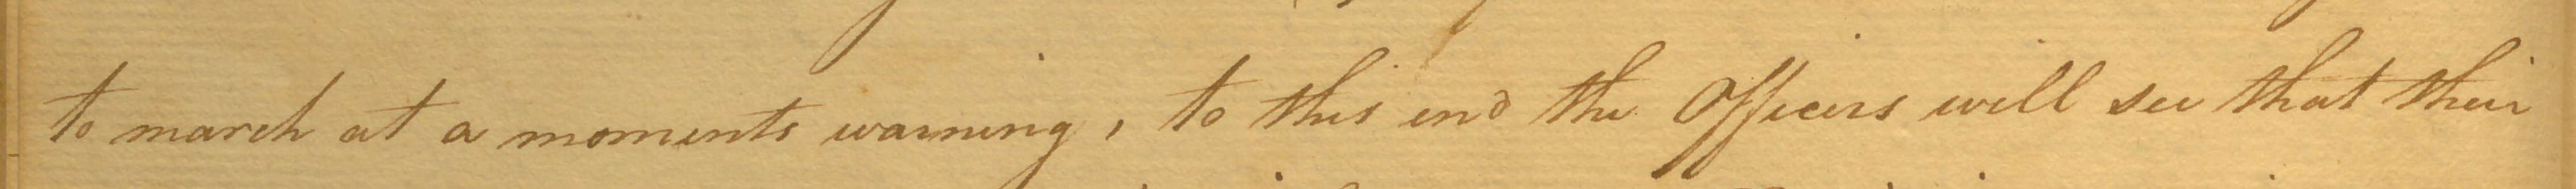to march at a moments warning, to this end the Officers will see that their
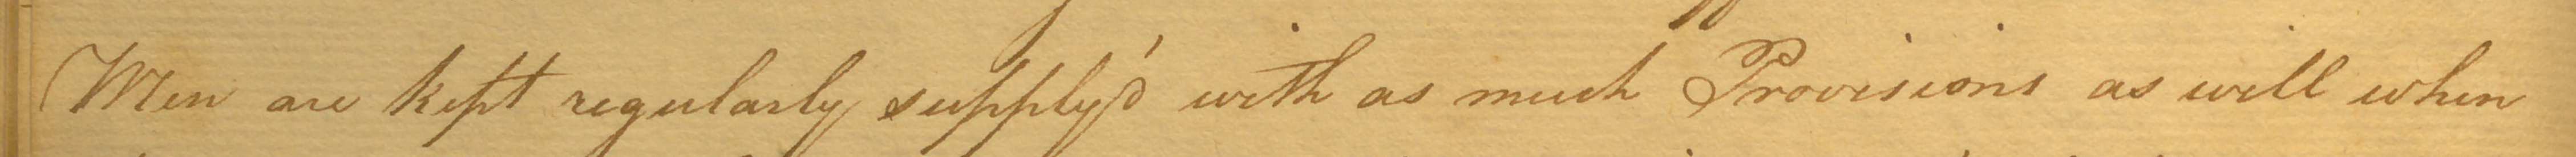Men are kept regularly supply'd with as much Provisions as will when
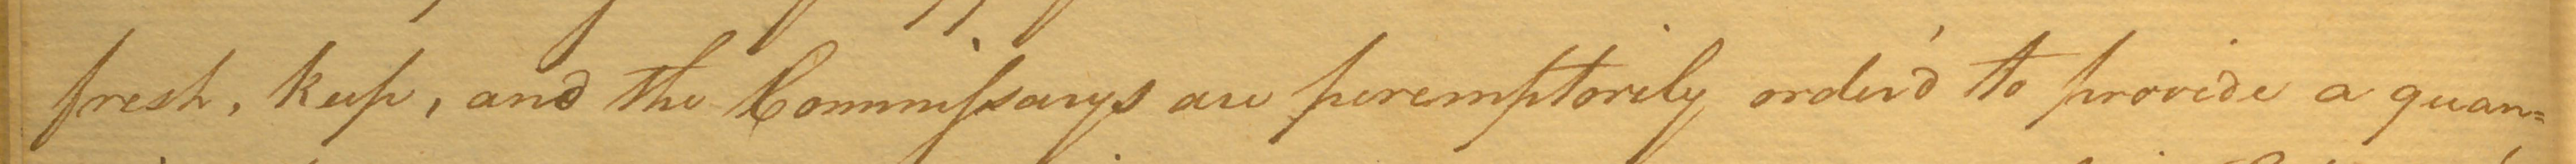fresh, keep, and the Commissarys are peremptorily order'd to provide a quan-
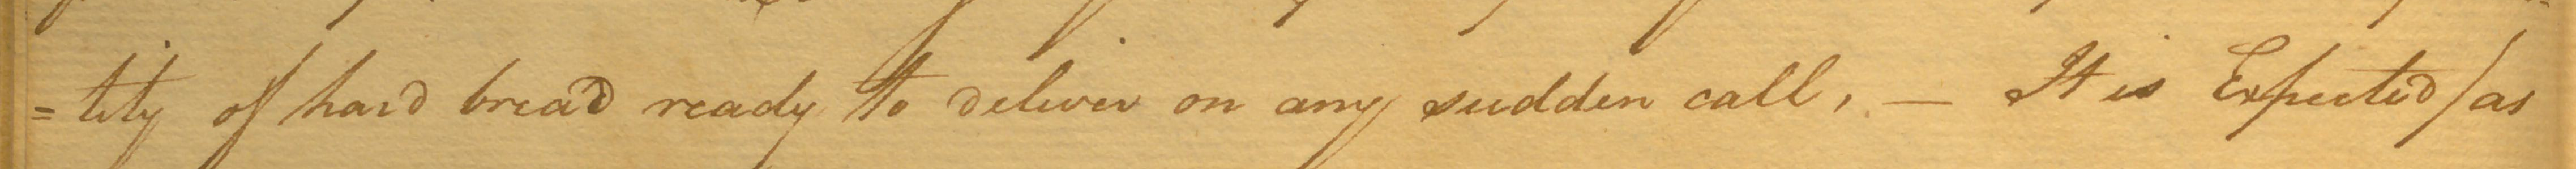-tity of hard bread ready to deliver on any sudden call,- It is Expected /as
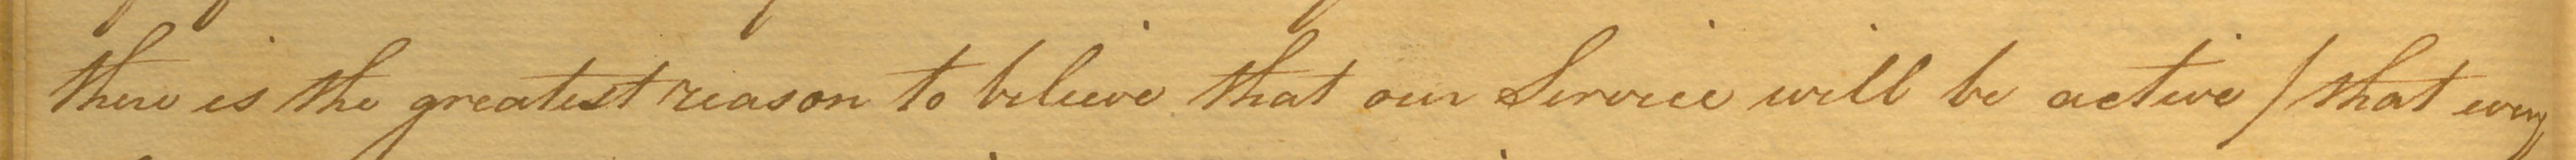there is the greatest reason to believe that our Service will be active/ that every
